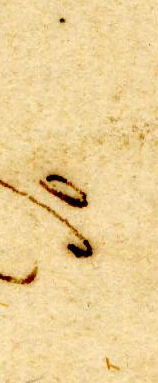To
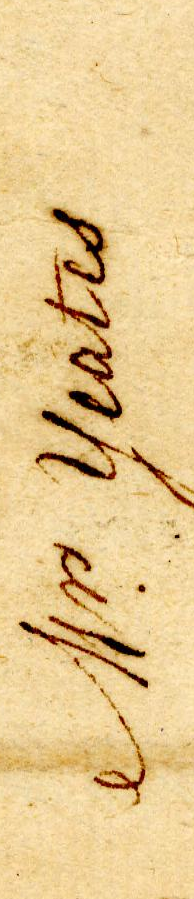M^rs. Yeates
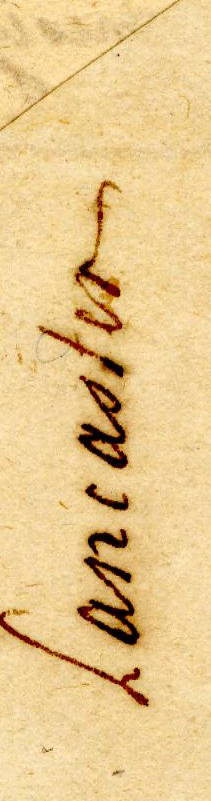Lancaster
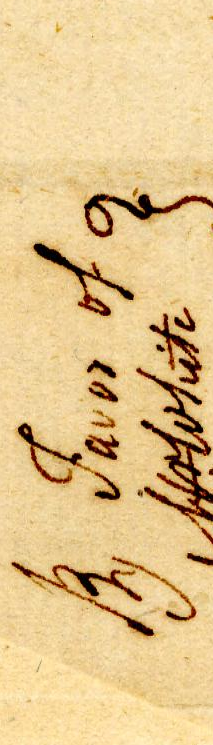By Favor of
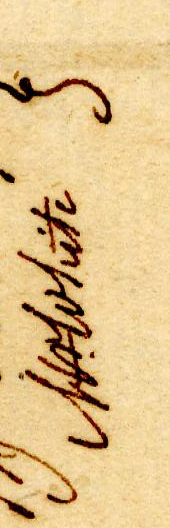M^r. White
